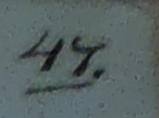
47.
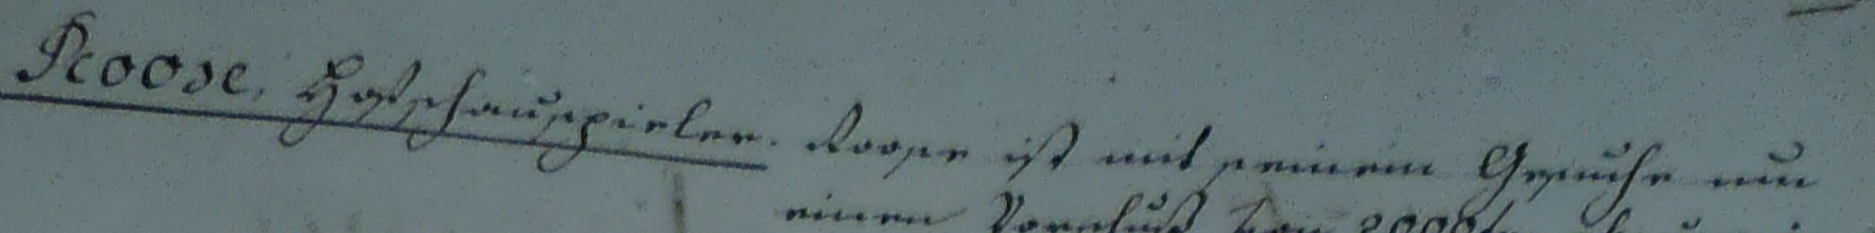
Roose, Hofschauspieler. Roose ist mit seinem Gesuche um
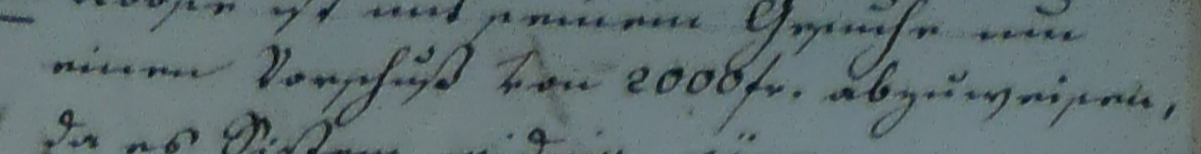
einen Vorschuß von 2000fr. abzuweisen,
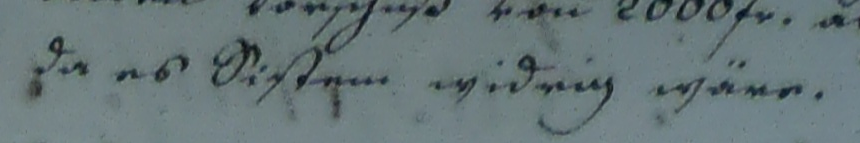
da es Sistem widrig wäre.
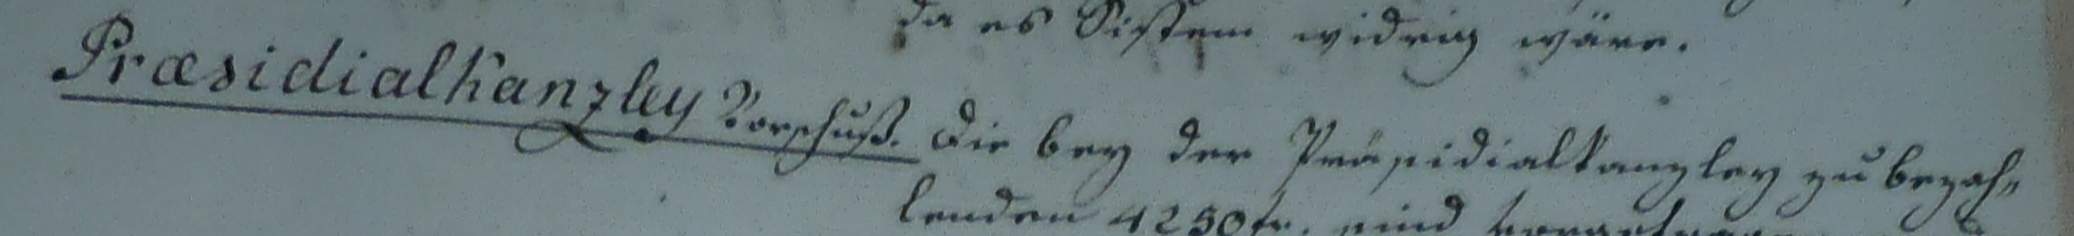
PræsidialKanzley Vorschuß. Die bey der Präsidialkanzley zu bezah¬
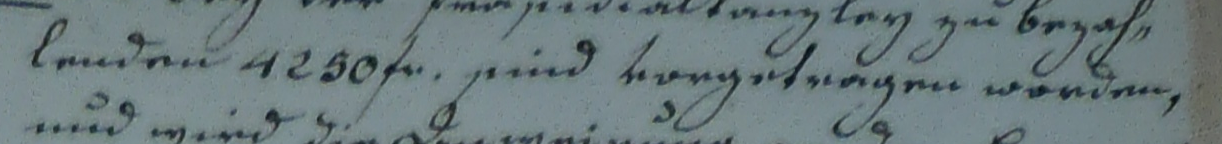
lenden 4250fr. sind vorgetragen worden,
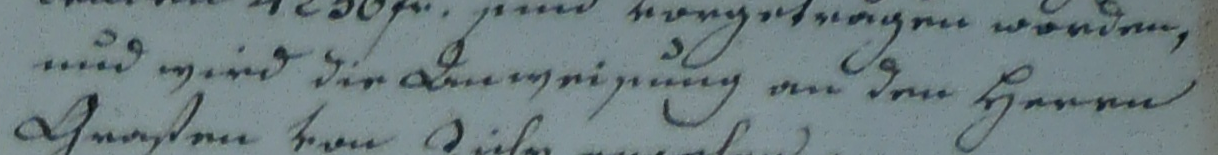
und wird die Anweisung an den Herrn
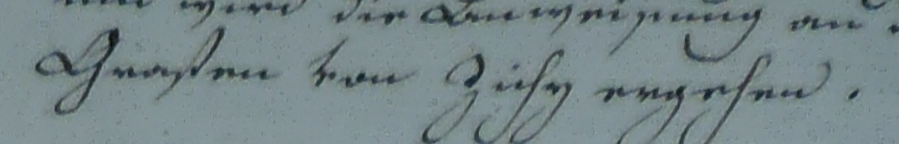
Grafen von Zichy ergehen.
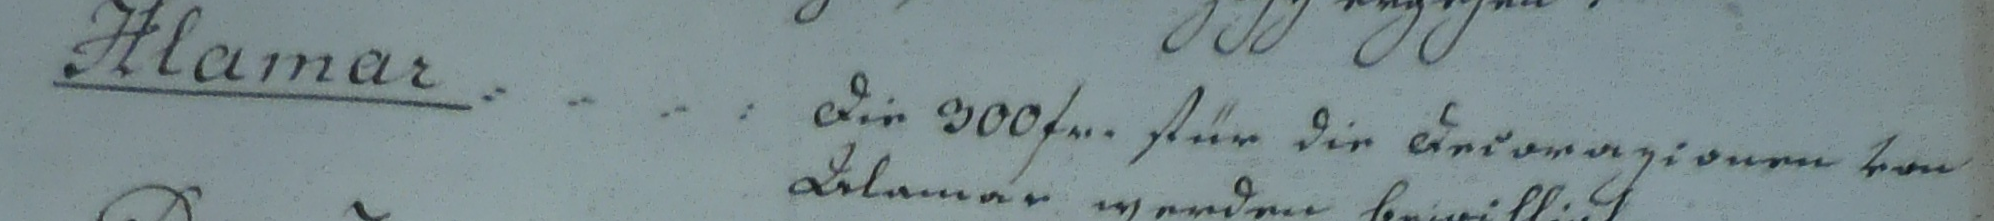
Alamar : : : : Die 300fr. für die Decorazionen von
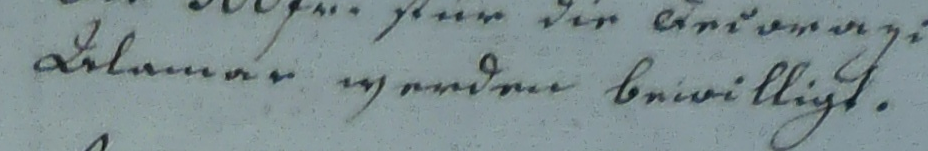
Alamar werden bewilligt.
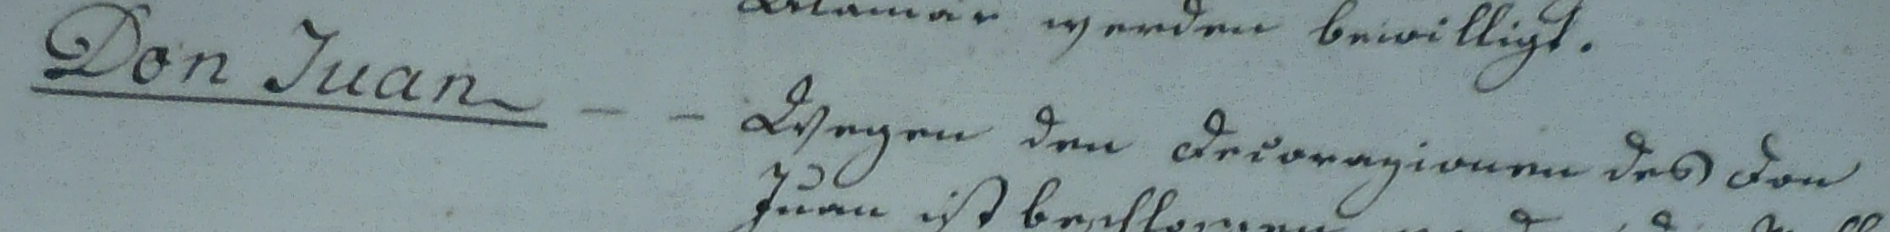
Don Juan _ _ Wegen den Decorazionen des Don
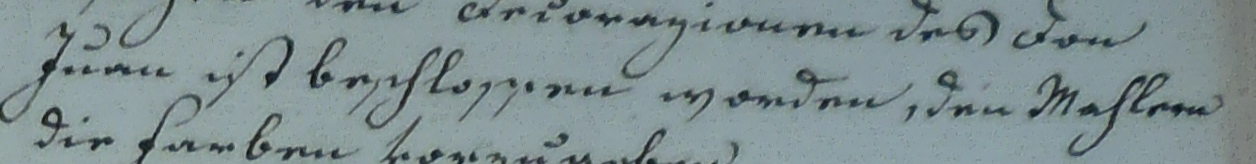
Juan ist beschlossen worden, den Mahlern
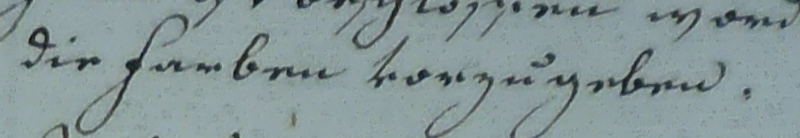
die Farben vorzugeben.
